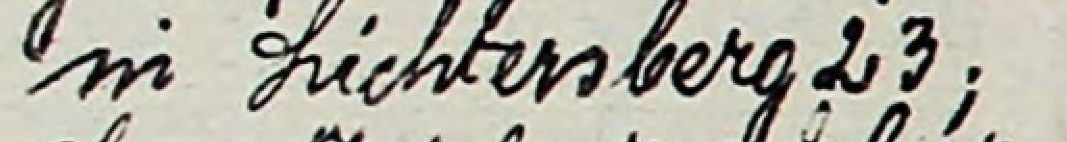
in Lichtersberg 23;
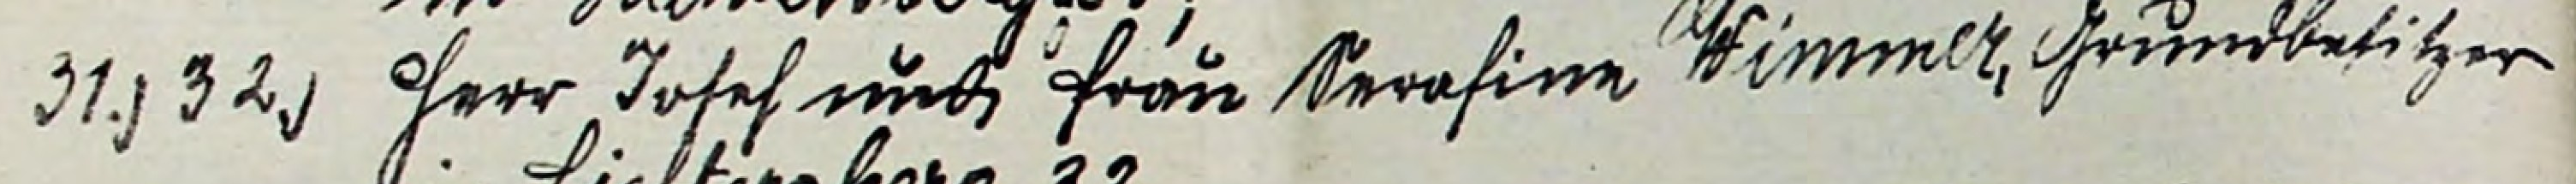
31.) 32.) Herr Josef und Frau Serafine Wimmer, Grundbesitzer
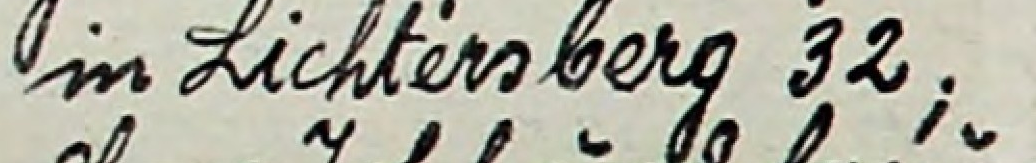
in Lichtersberg 32;
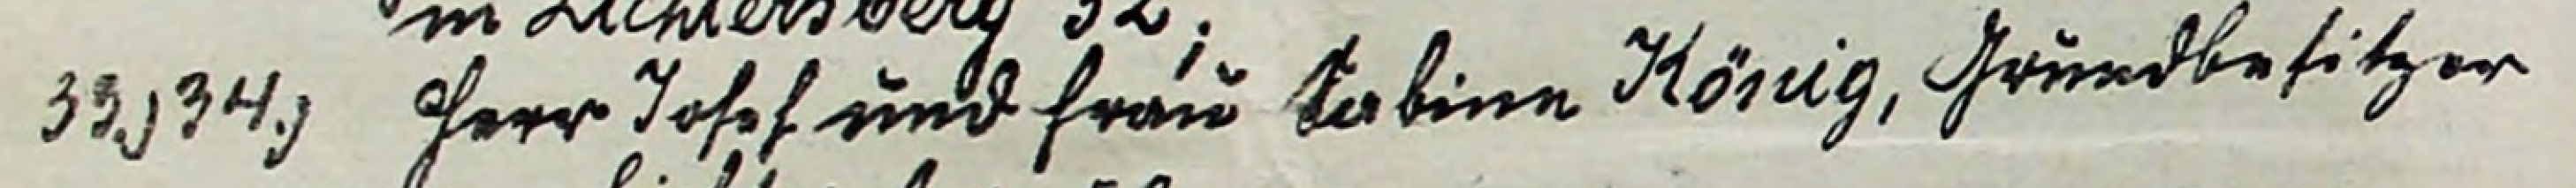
33.) 34.) Herr Josef und Frau Sabine König, Grundbesitzer
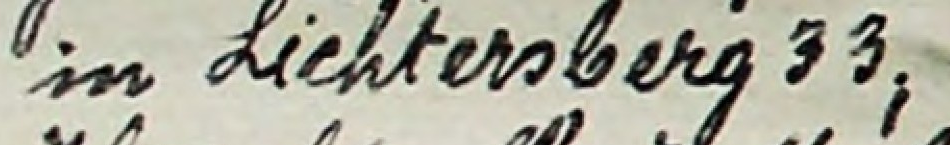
in Lichtersberg 33;
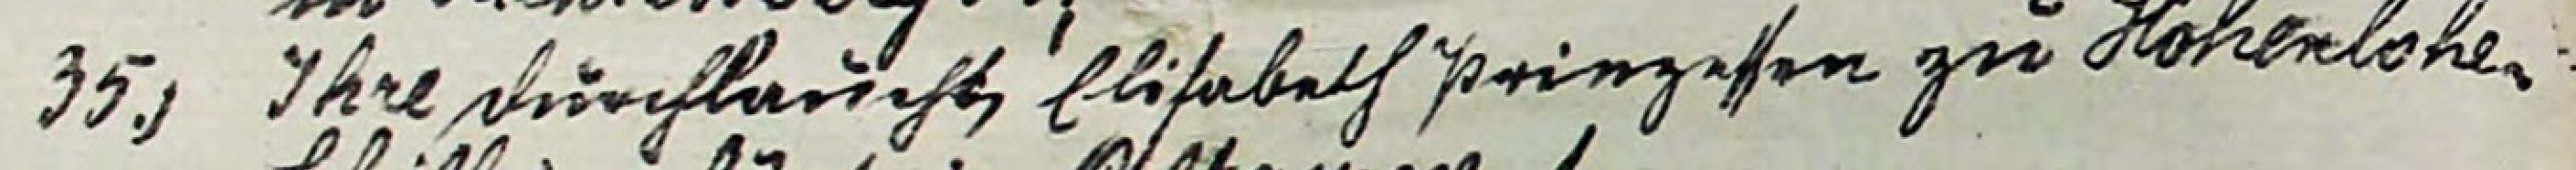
35.) Ihre durchlaucht, Elisabeth Prinzessen zu Hohenlohe,
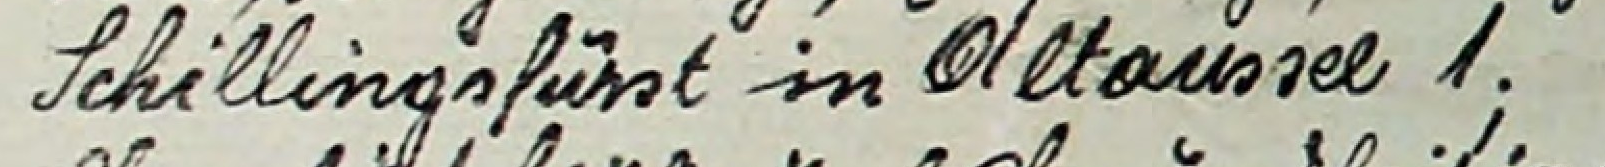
Schillingsfürst in Altaussee 1;
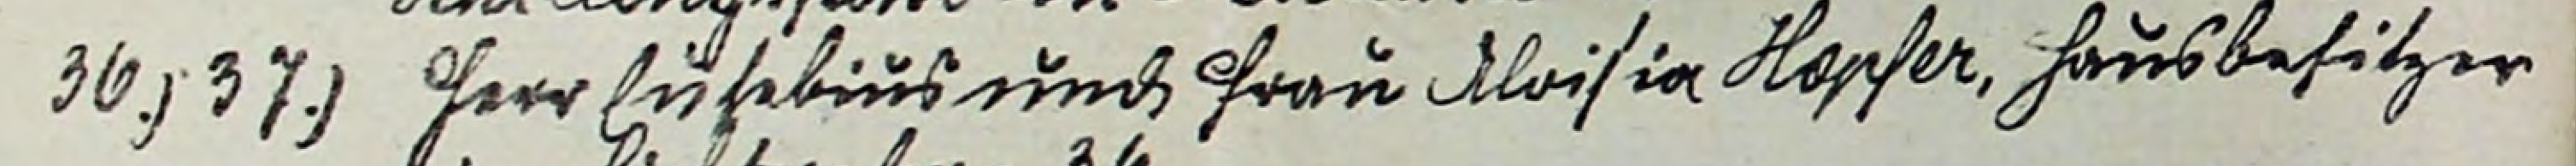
36.) 37.) Herr Eusebius und Frau Aloisia Hopfer, Hausbesitzer
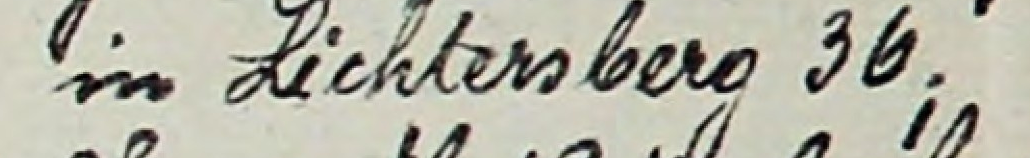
in Lichtersberg 36;
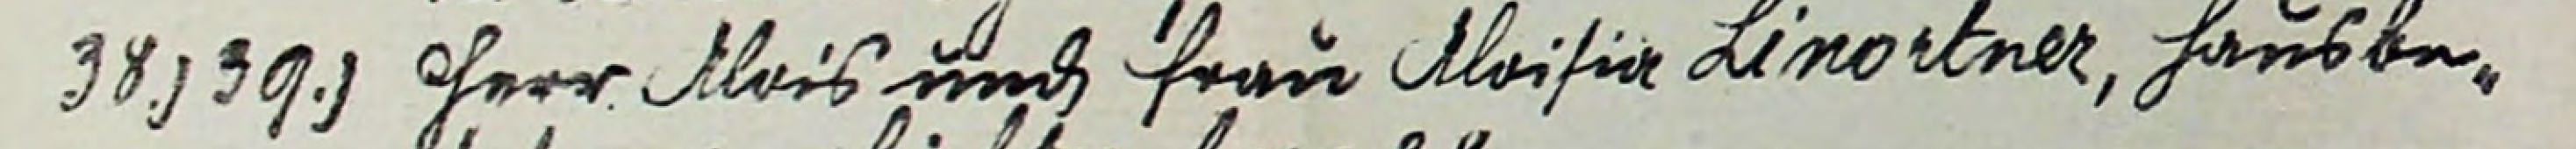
38.) 39.) Herr Alois und Frau Aloisia Linortner, Hausbe„
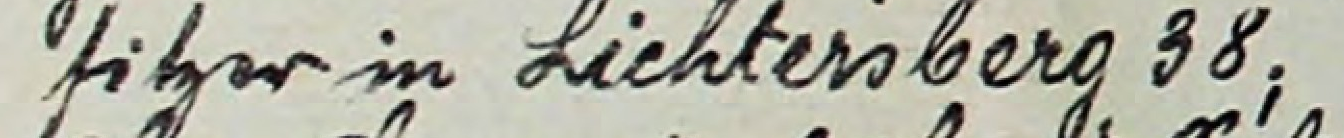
sitzer in Lichtersberg 38;
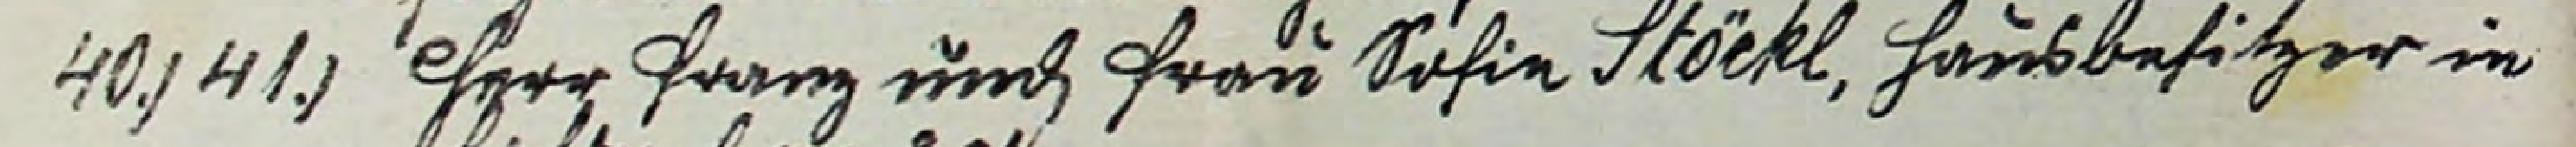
40.) 41.) Herr Franz und Frau Sofie Stöckl, Hausbesitzer in
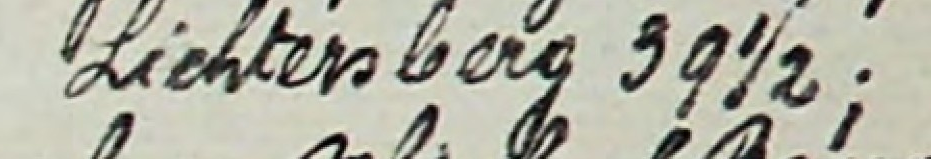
Lichtersberg 39 1/2;
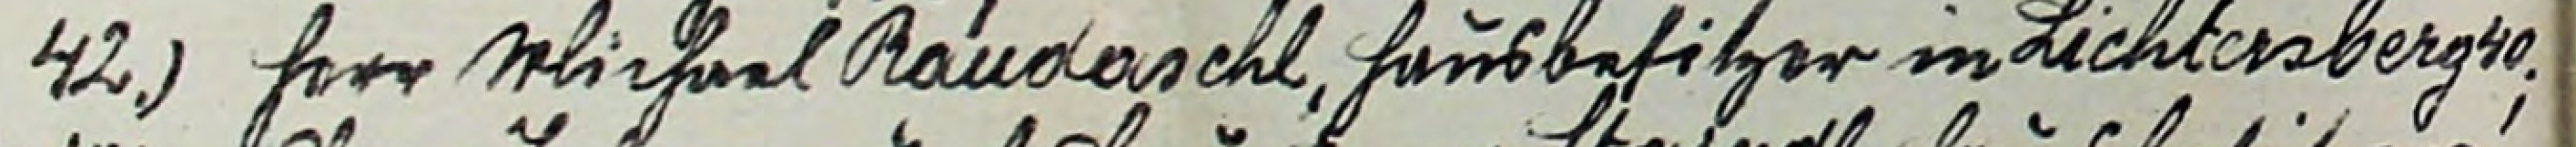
42.) Herr Michael Raudaschl, Hausbesitzer in Lichtersberg 40;
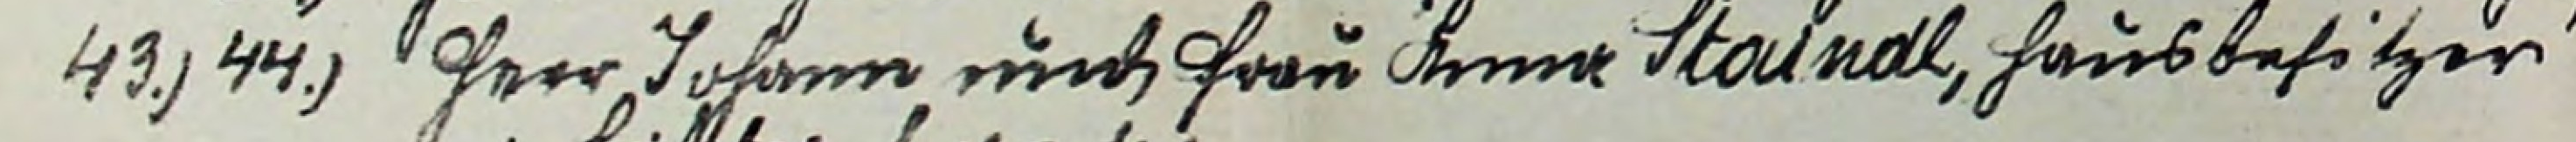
43.) 44.) Herr Johann und Frau Anna Staindl, Hausbesitzer
